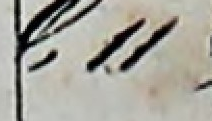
0,11
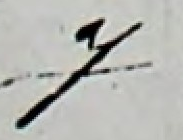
7
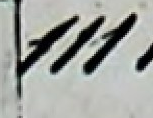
111
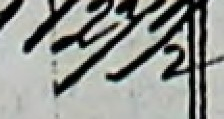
127 ½
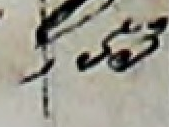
0,53
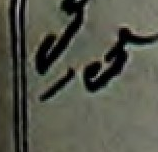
3,5
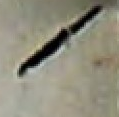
1
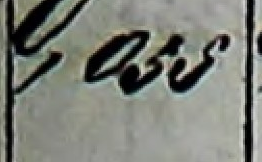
0,055
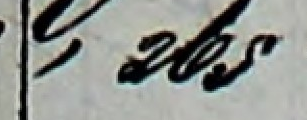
0,265
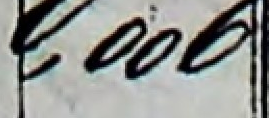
0,006
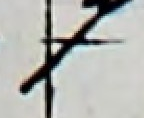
7
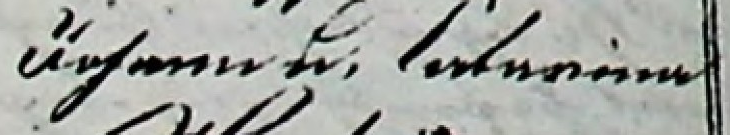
Johann u. Catarina
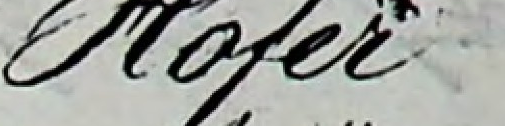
Hofer
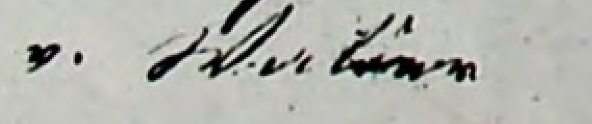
v. Watner
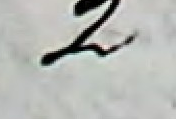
2
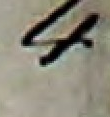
4
